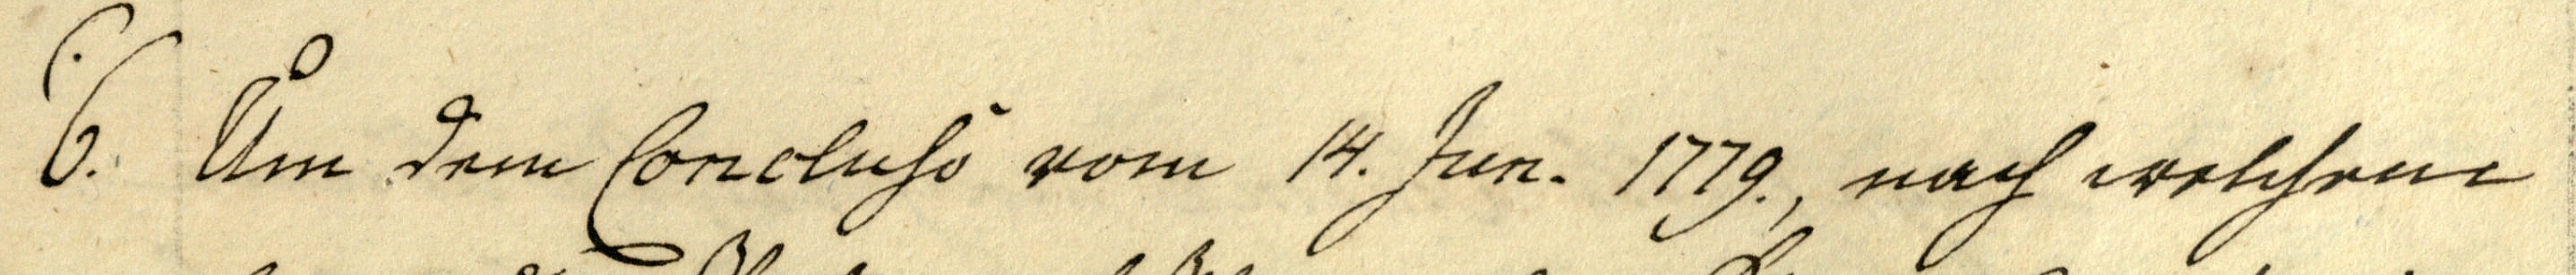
6. Um dem Concluso vom 14. Jun. 1779., nach welchem
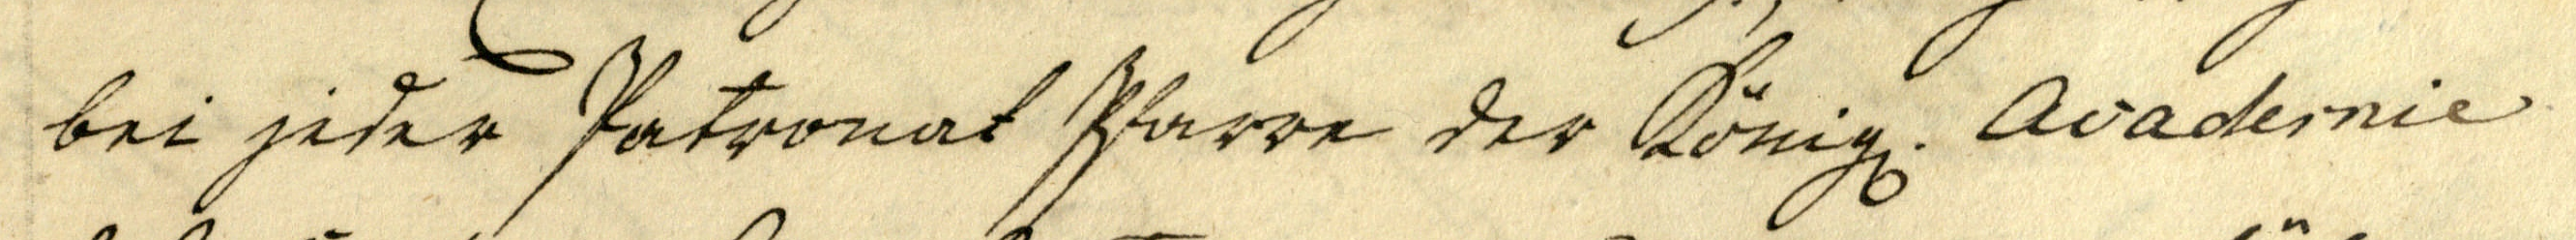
bei jeder Patronat Pfarre der Königl. Academie
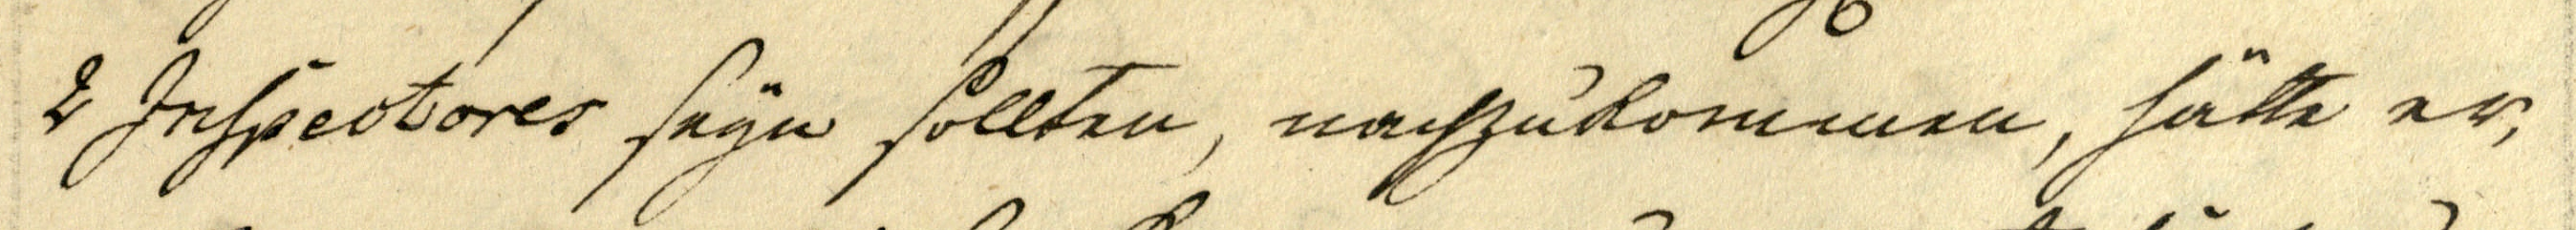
2 Inspectores seyn sollten, nachzukommen, hätte er,
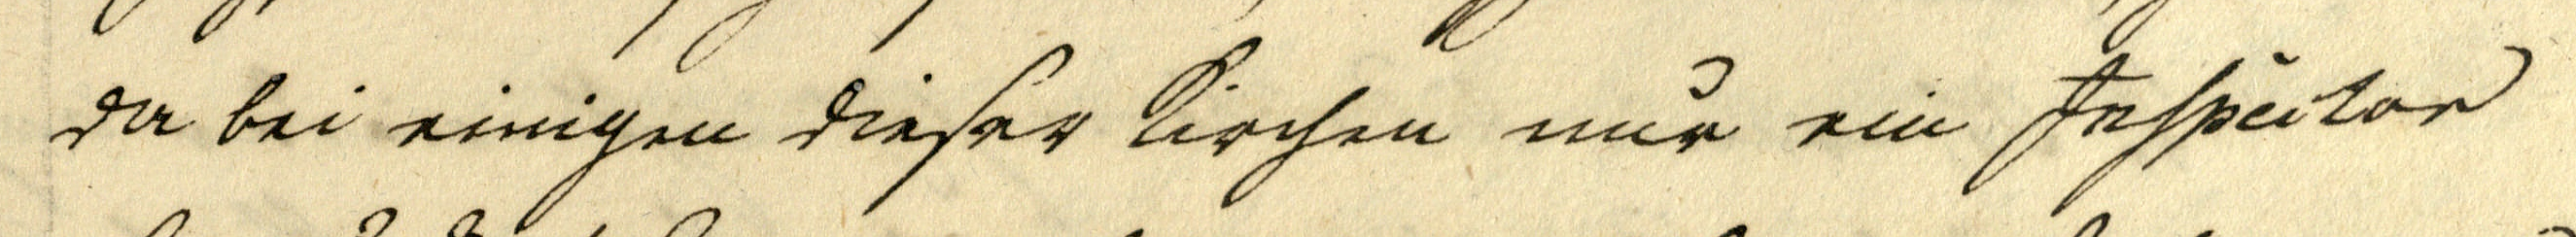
da bei einigen dieser Kirchen nur ein Inspector
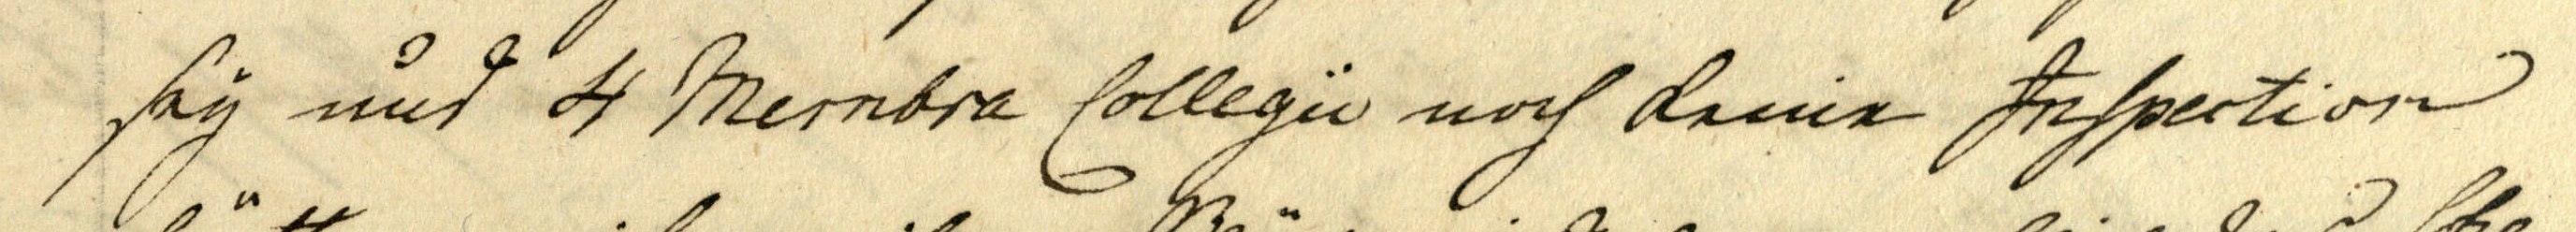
sey und 4 Membra Collegii noch keine Inspection
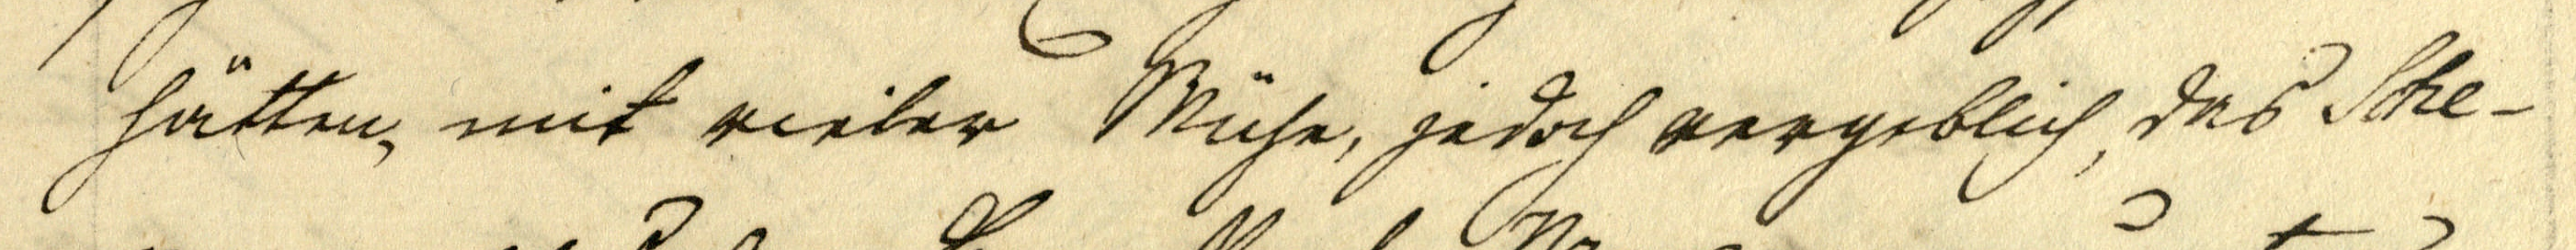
hätten, mit vieler Mühe, jedoch vergeblich, das Sche-
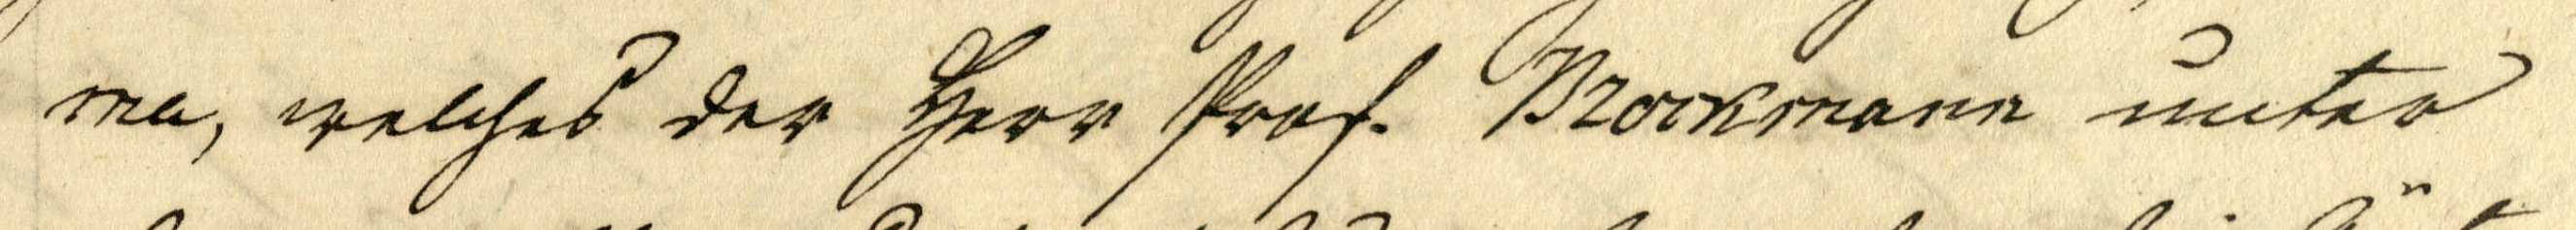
ma, welches der Herr Prof. Brockmann unter
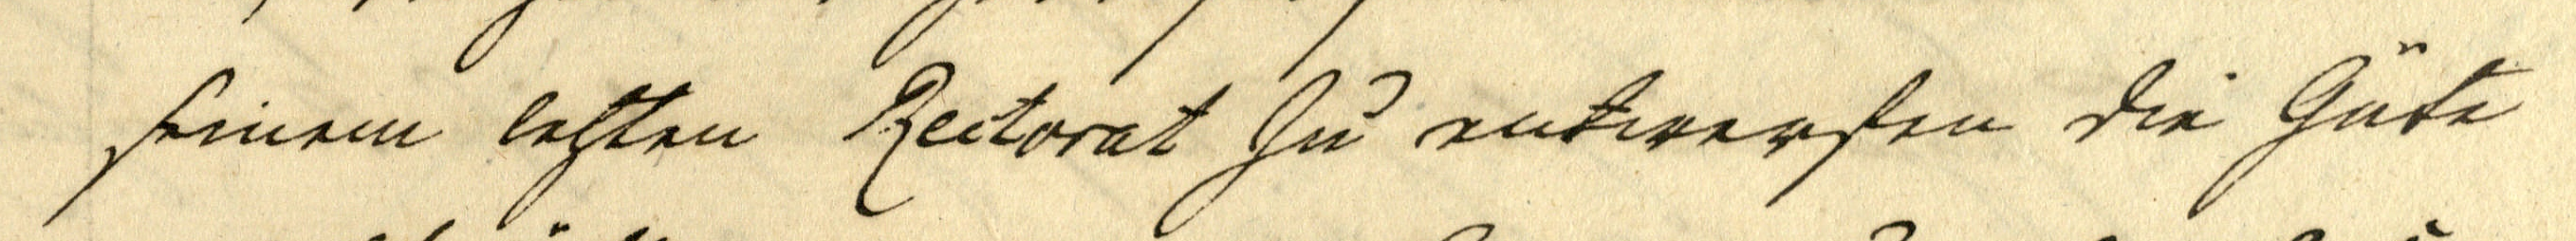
seinem letzten Rectorat zu entwerfen die Güte
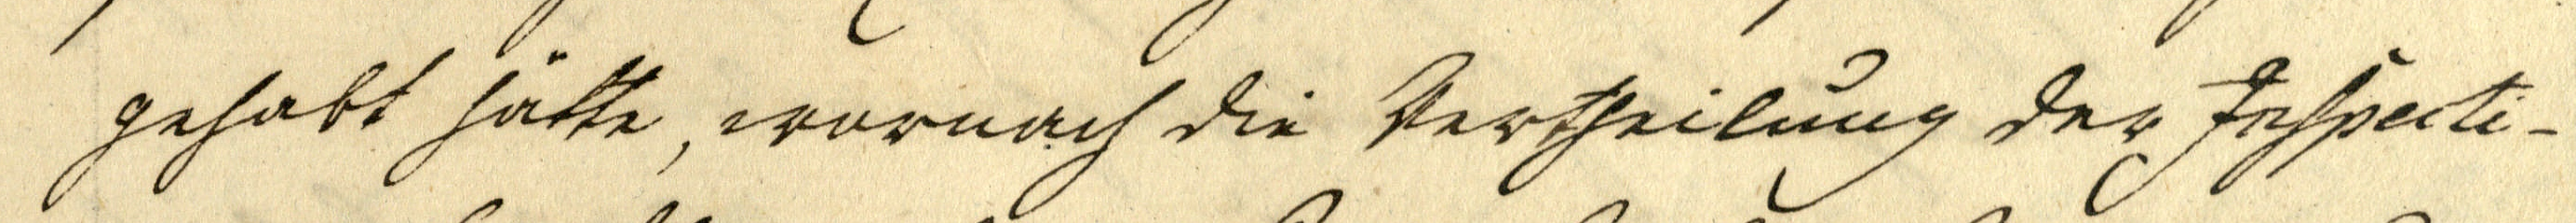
gehabt hätte, wornach die Vertheilung der Inspecti-
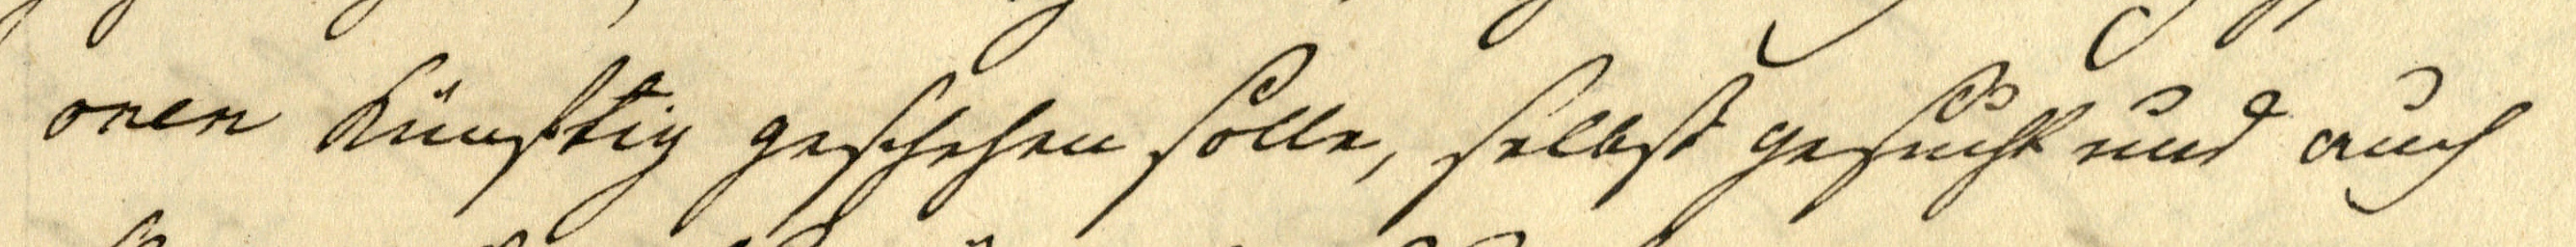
onen künftig geschehen solle, selbst gesucht und auch
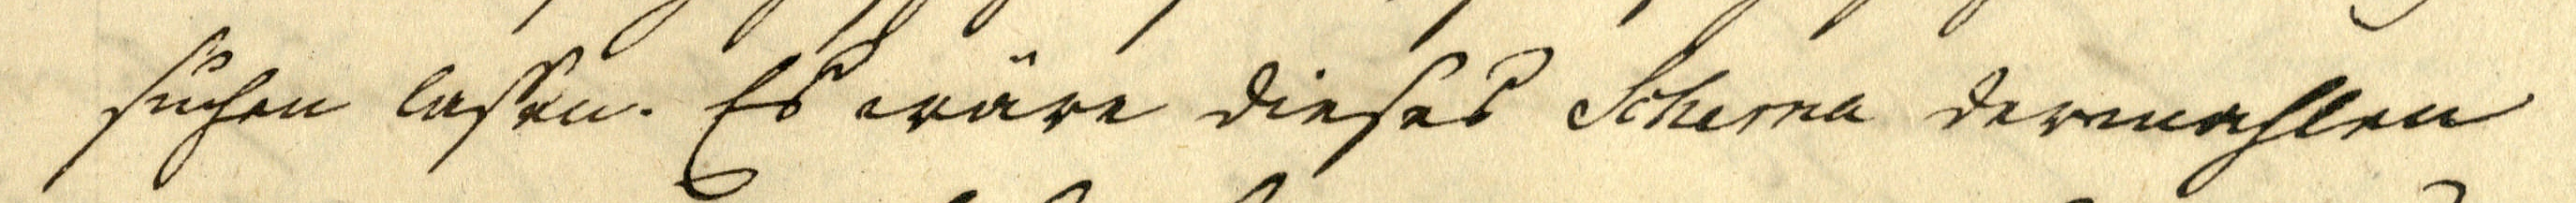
suchen lassen. Es wäre dieses Schema dermahlen
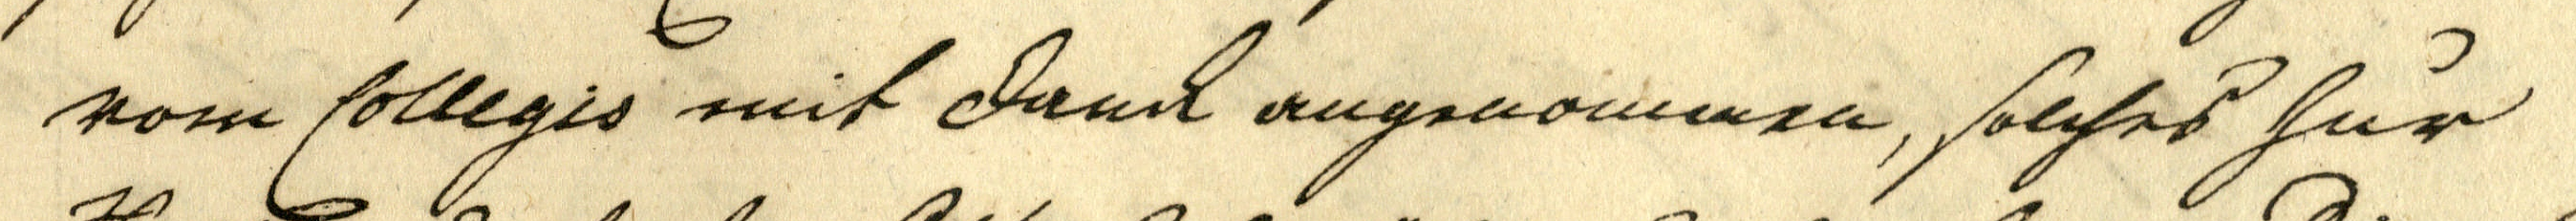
vom Collegio mit Dank angenommen, solches zur
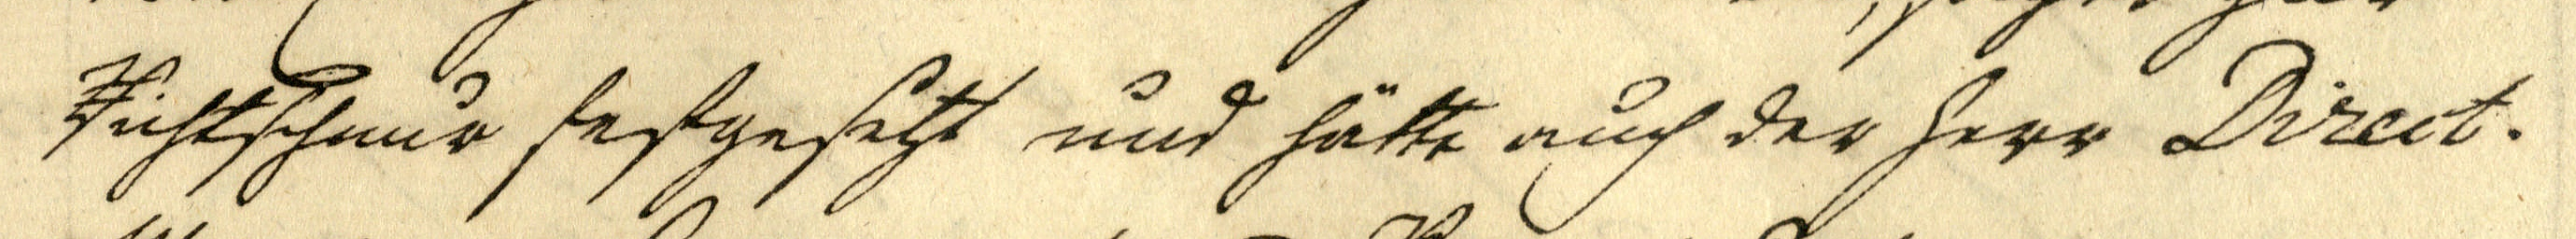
Richtschnur festgesetzt und hätte auch der Herr Direct.
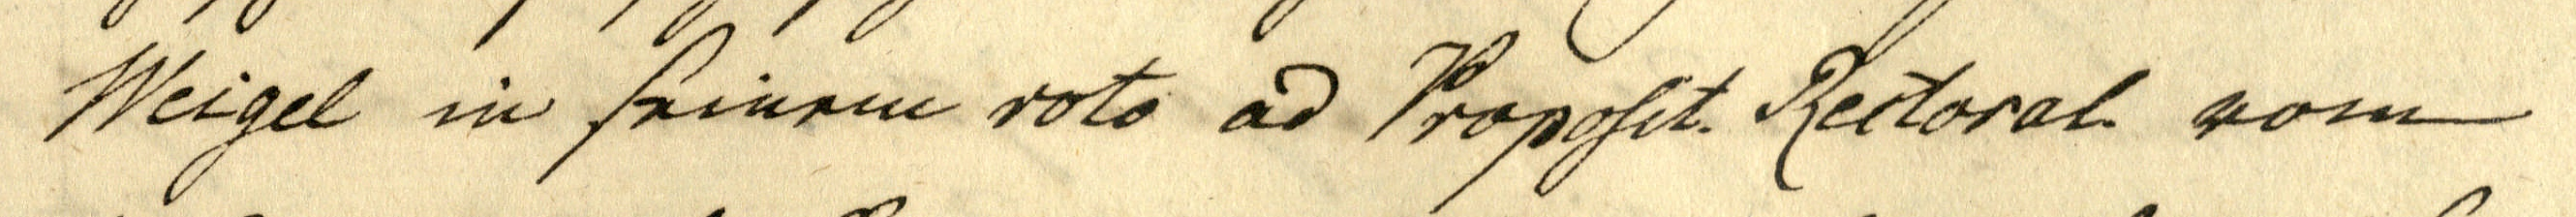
Weigel in seinem voto ad Proposit. Rectoral. vom
